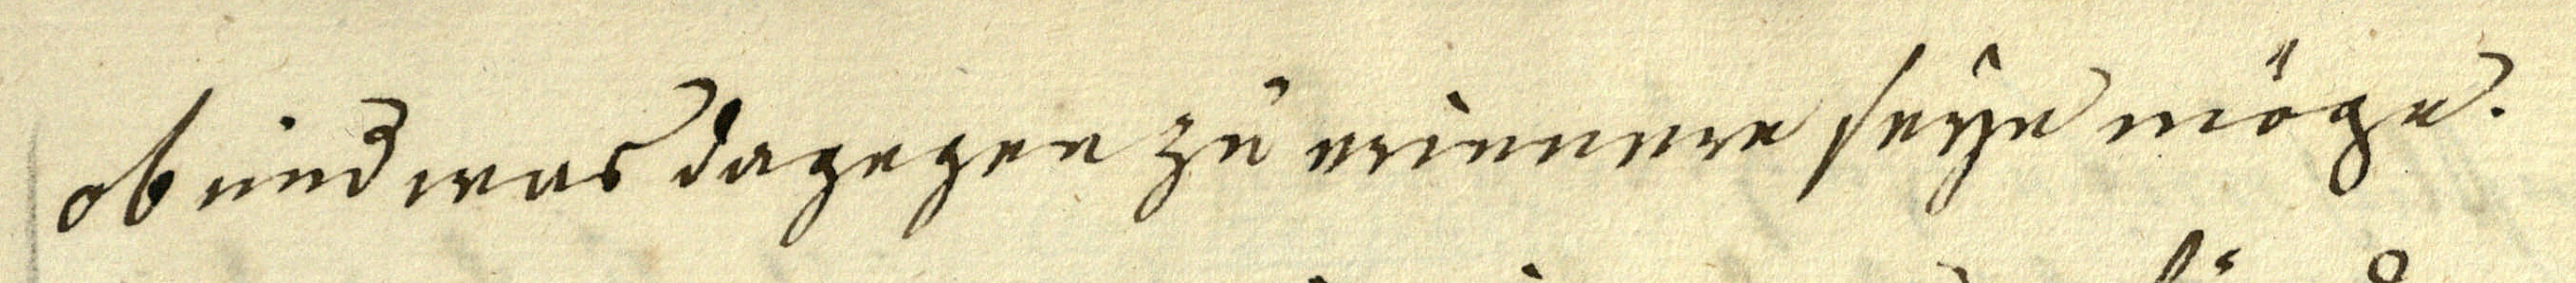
ob und was dagegen zu erinnere seÿn möge.
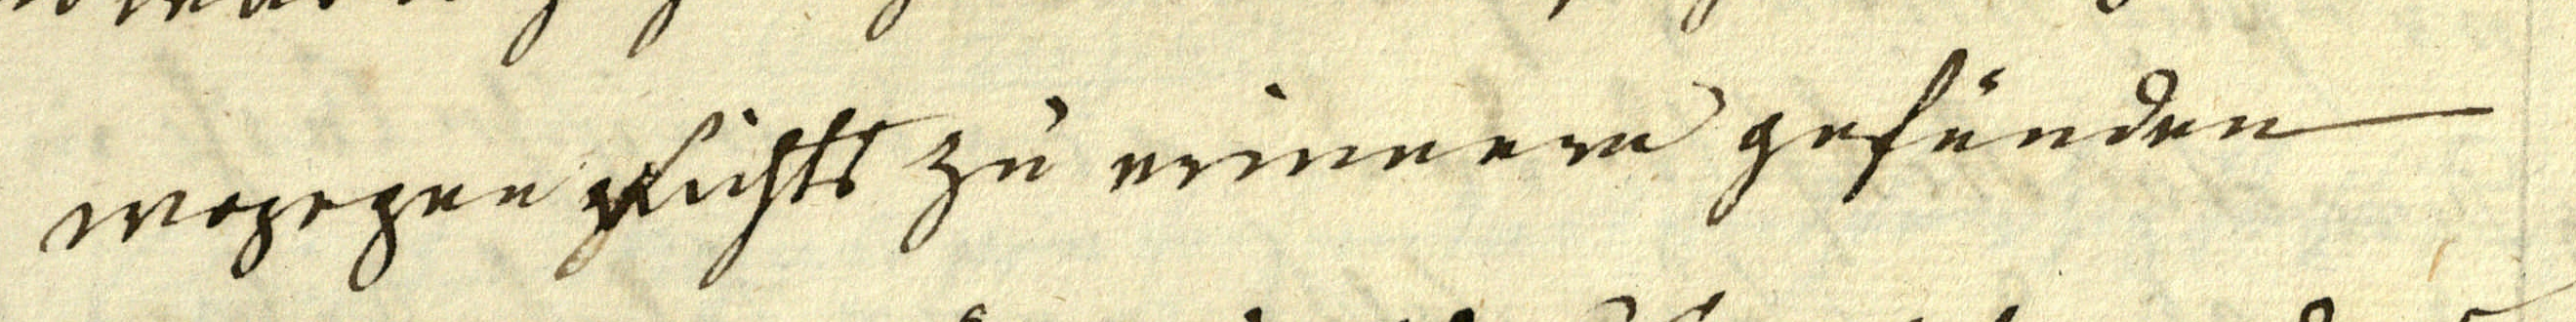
wogegen nichts zu erinnern gefunden
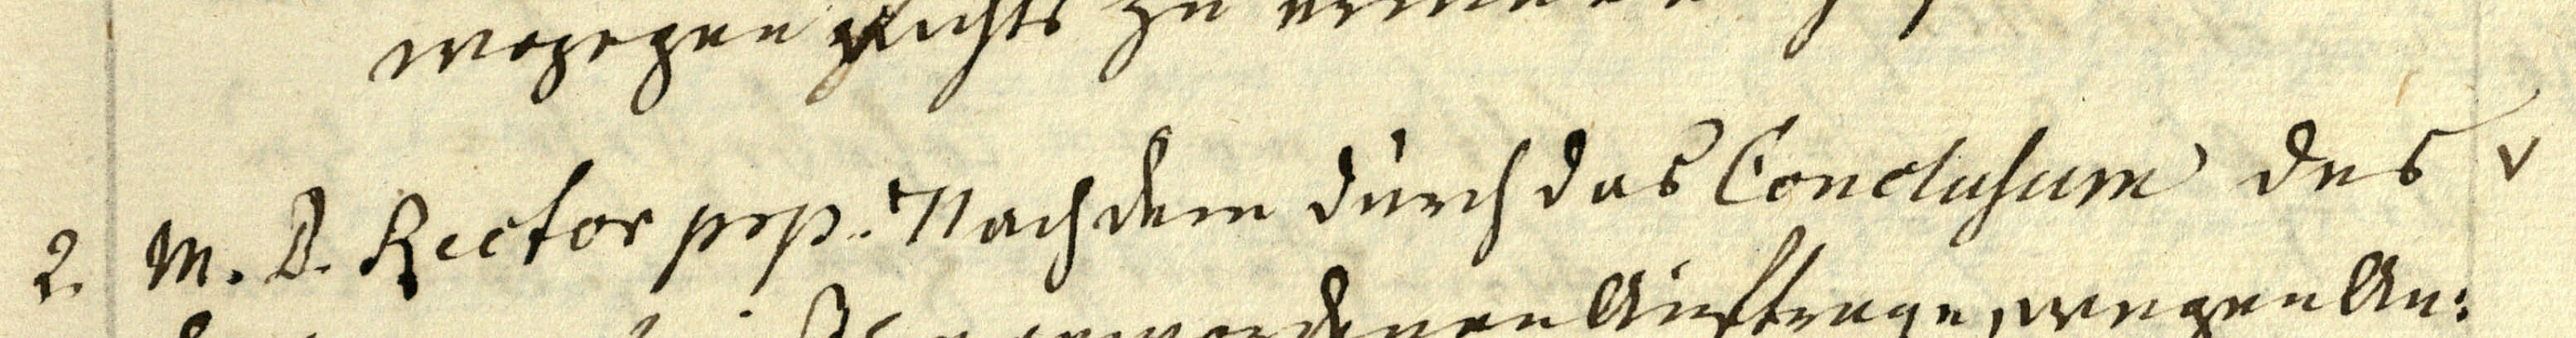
2. M. D. Rector prp. Nachdem durch das Conclusum des
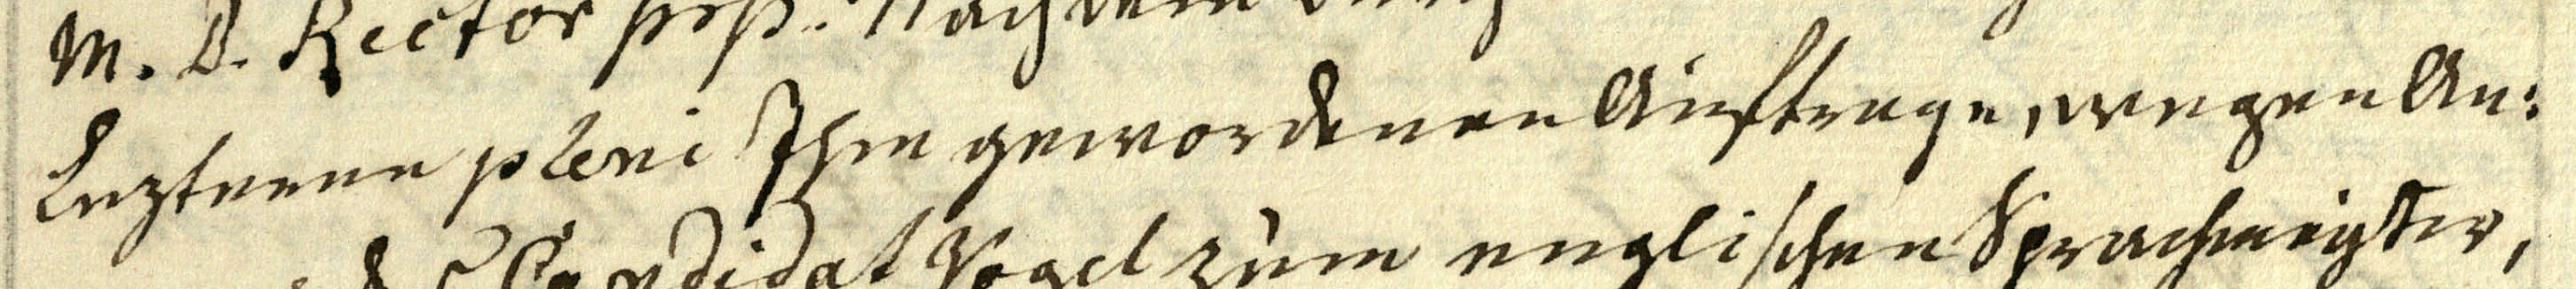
lezteren pleni Ihm gewordenen Auftrage, wegen An¬
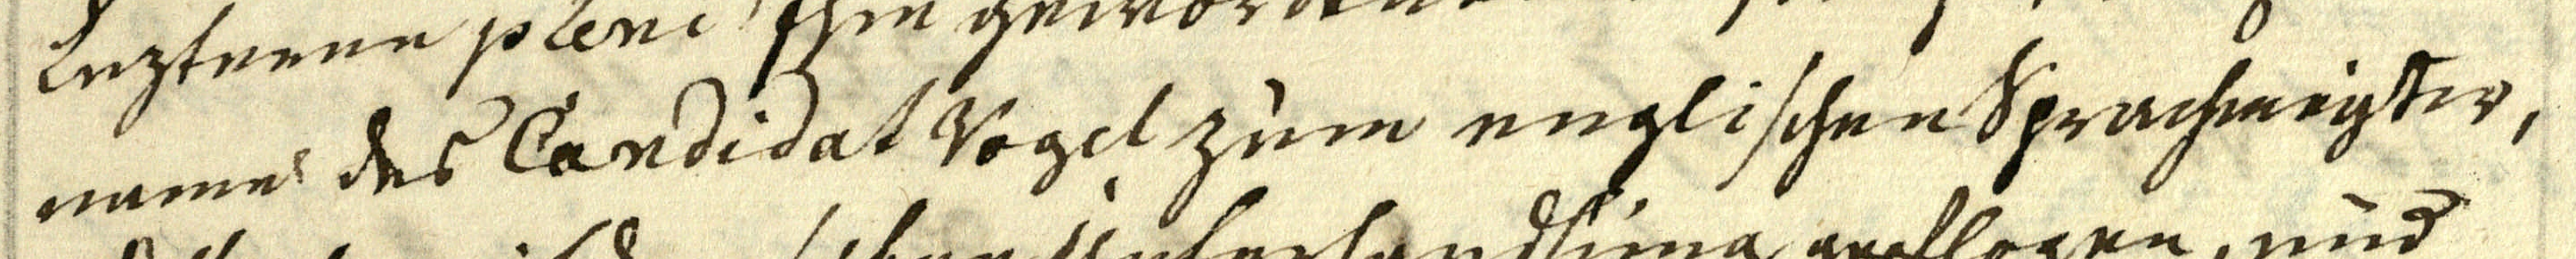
name des Candidat Vogel zum englischen Sprachmeister,
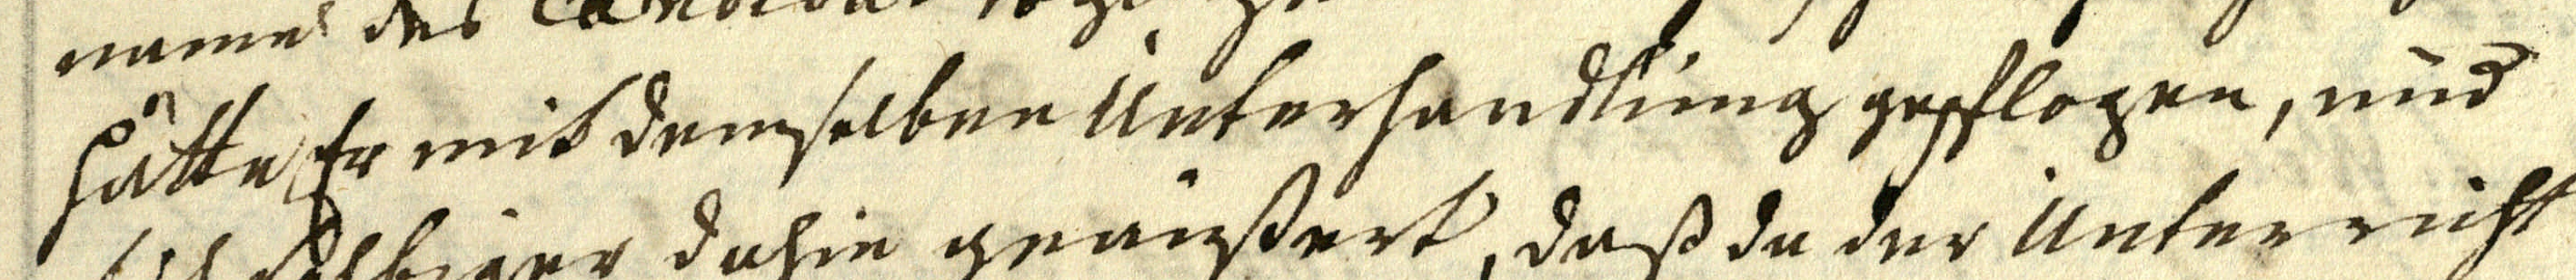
hätte Er mit demselben Unterhandlung gepflogen, und
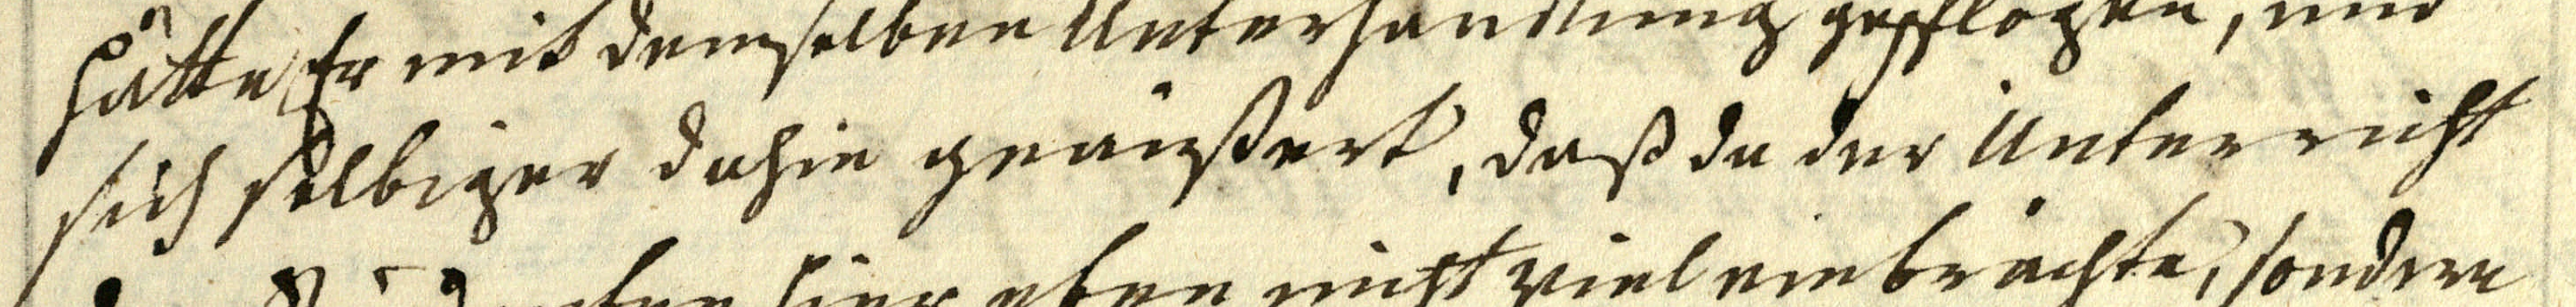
sich selbiger dahin geäußert, daß da der Unterricht
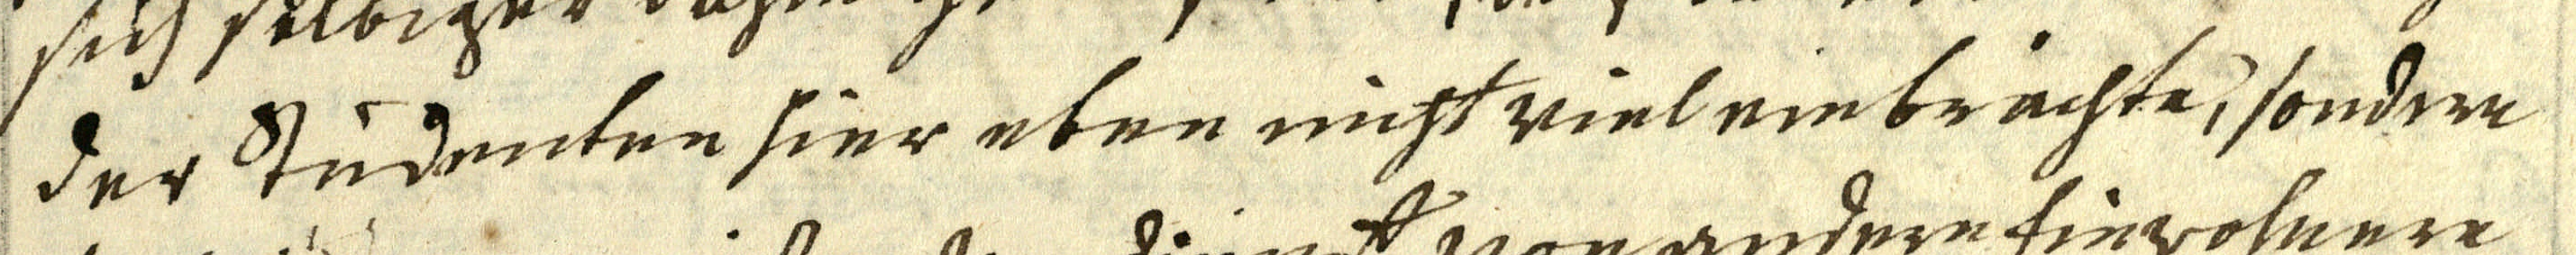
der Studenten hier eben nicht viel einbrächte, sondern
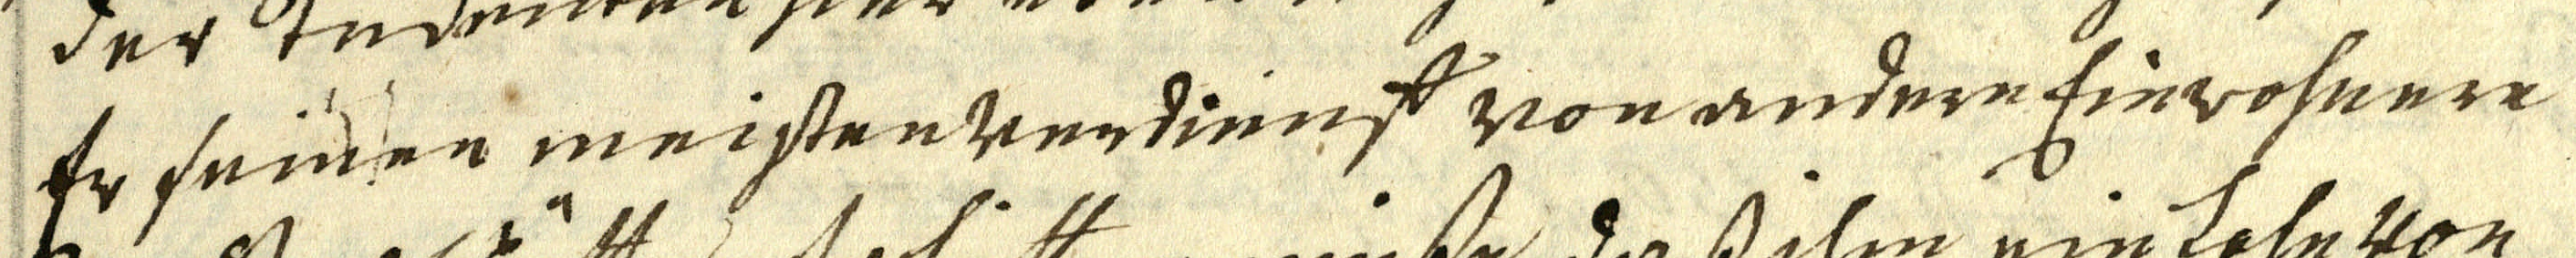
Er seinen meisten Verdienst von andern Einwohnern
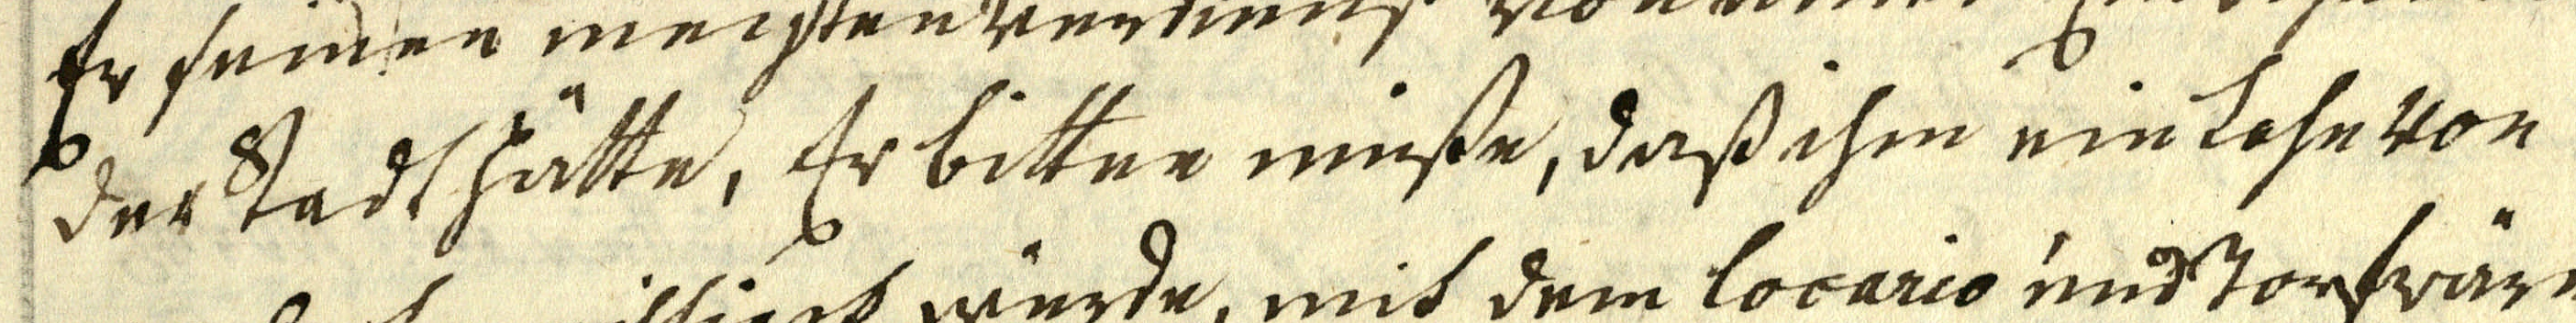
der Stadt hätte, Er bitten müße, daß ihm ein Lohn von
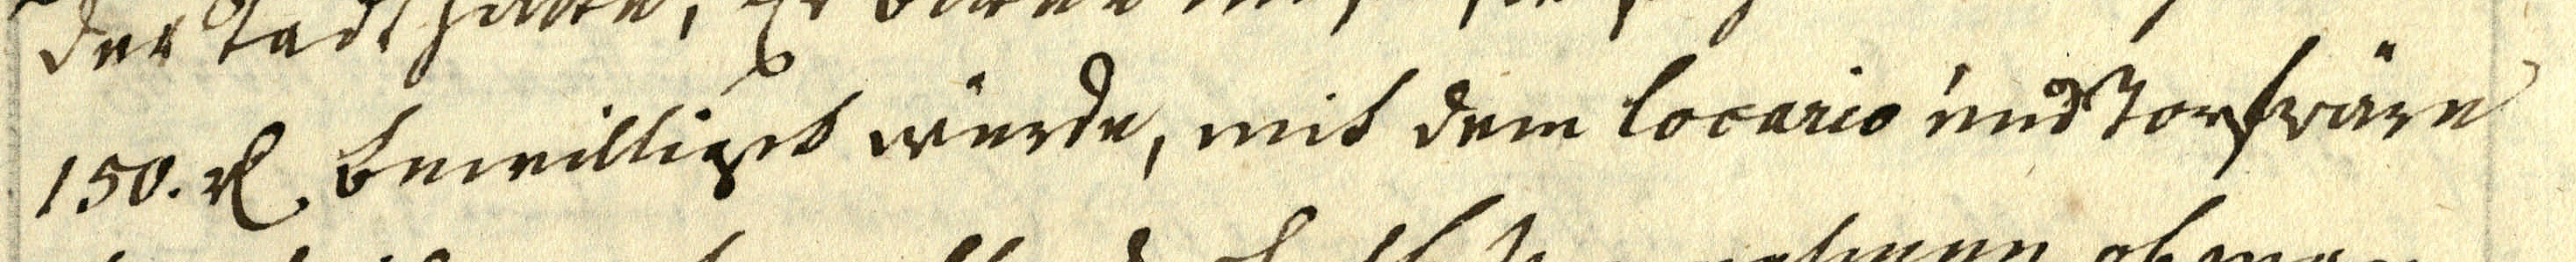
150. r bewilliget würde, mit dem Locario und Torf wäre
